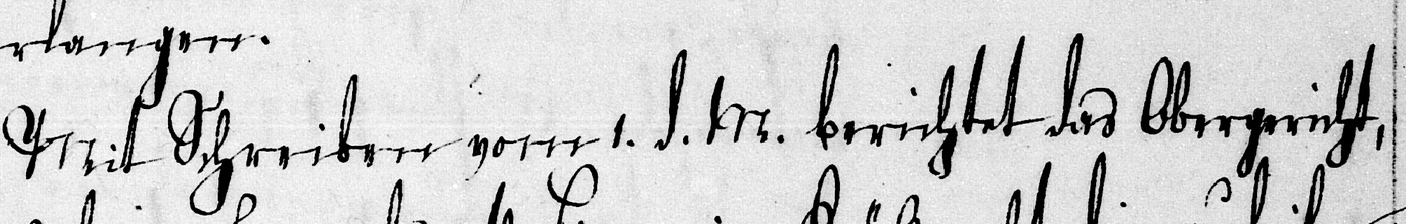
Mit Schreiben vom 1. d. M. berichtet das Obergericht,
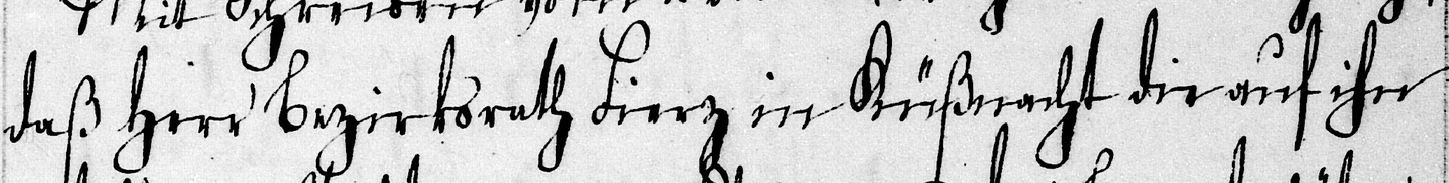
daß Herr Bezirksrath Fierz in Küßnacht die auf ihn
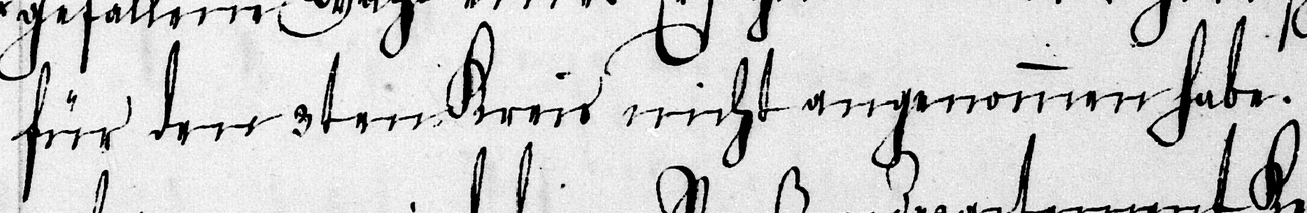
für den 3ten Kreis nicht angenommen habe.
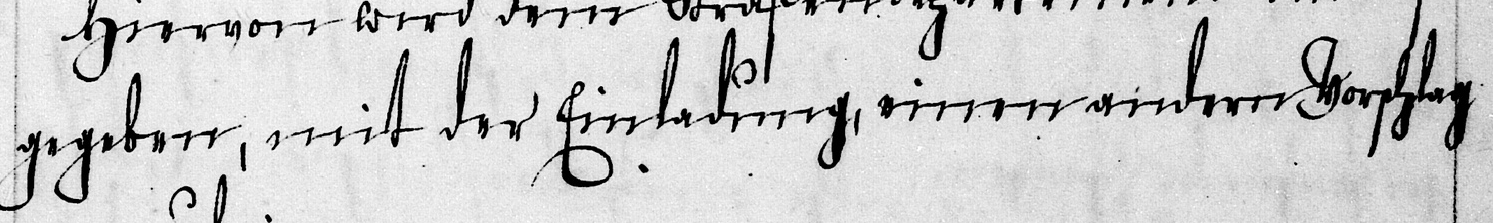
gegeben, mit der Einladung, einen andern Vorschlag
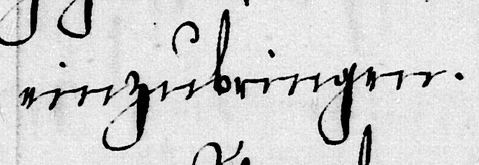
einzubringen.
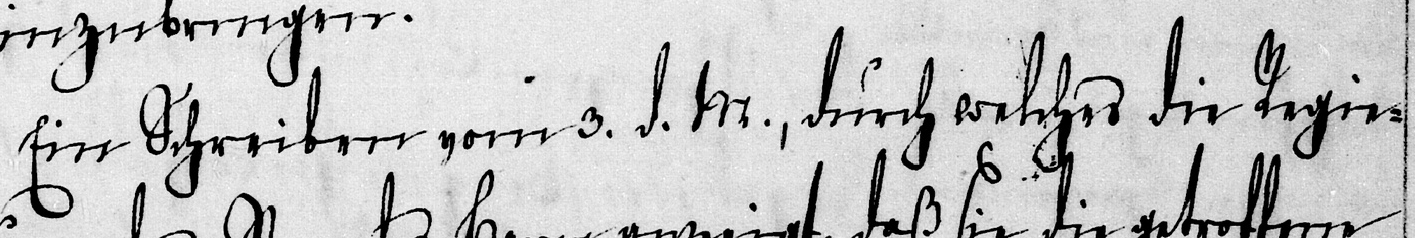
Ein Schreiben vom 3. d. M., durch welches die Regie¬
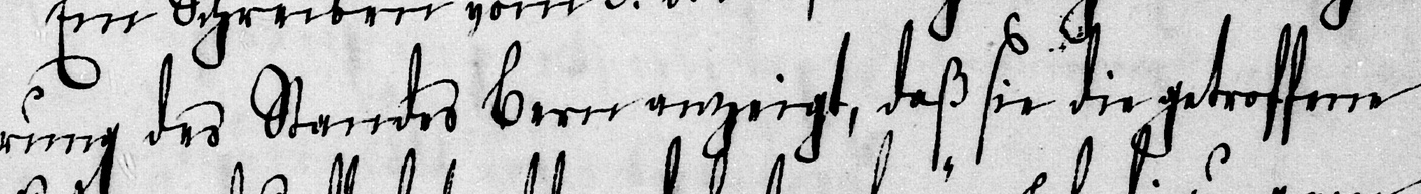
rung des Standes Bern anzeigt, daß sie die getroffene
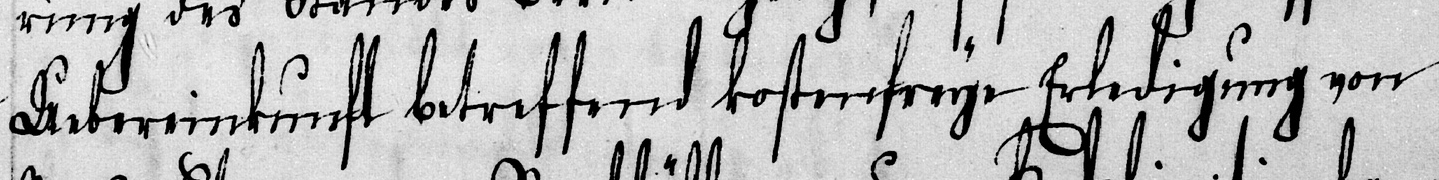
Uebereinkunft betreffend kostenfreye Erledigung von
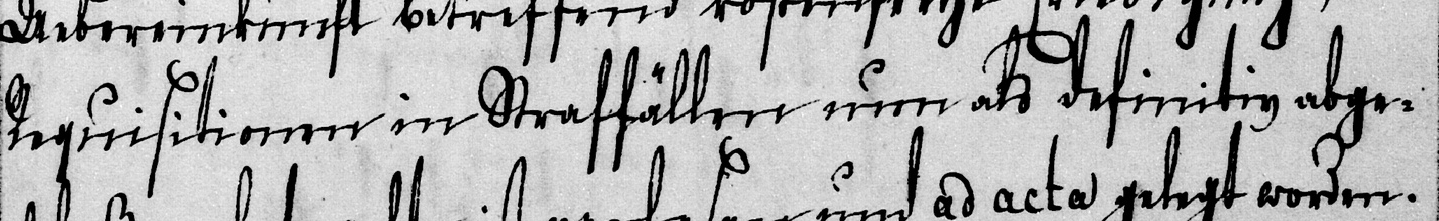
Requisitionen in Straffällen nun als definitv abge¬
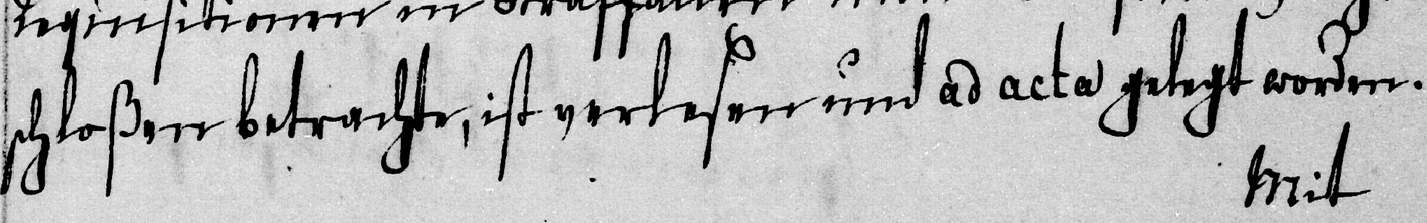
schloßen betrachte, ist verlesen und ad acta gelegt worden.
